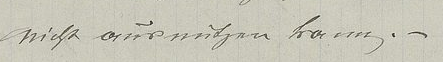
nicht ausnützen kann. –
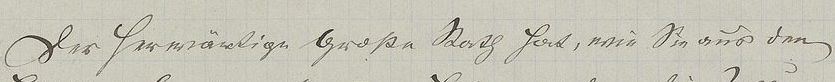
Der herwärtige Große Rath hat, wie Sie aus den
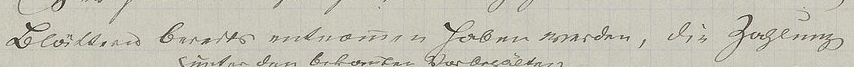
Blättern bereits entnommen haben werden, die Zahlung
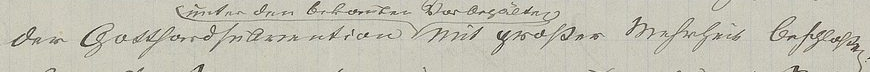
den bekannten Vorbehälten mit großer Mehrheit beschloßen.
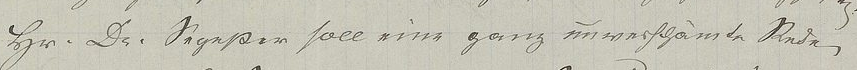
Hr. Dr. Segeßer soll eine ganz unverschämte Rede
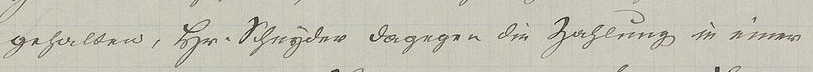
gehalten, Hr. Schnyder dagegen die Zahlung in einer
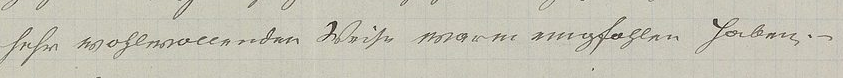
sehr wohlwollenden Weise warm empfohlen haben. –
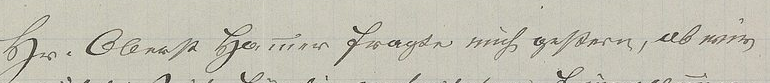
Hr. Oberst Hammer fragte mich gestern, ob wir
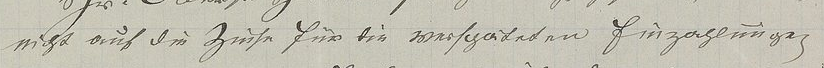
nicht auf die Zinse für die verspäteten Einzahlungen
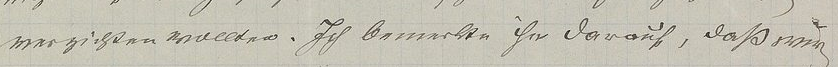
verzichten wollten. Ich bemerkte ihn darauf, daß wir
